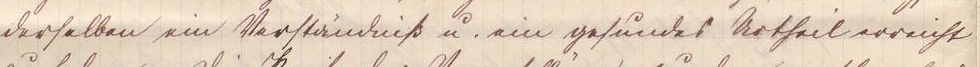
derselben ein Verständniß u. ein gesundes Urtheil erreicht
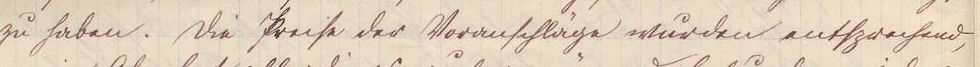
zu haben. Die Preise der Voranschläge wurden entsprechend,
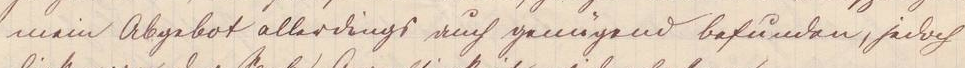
mein Abgebot allerdings auch genügend befunden, jedoch
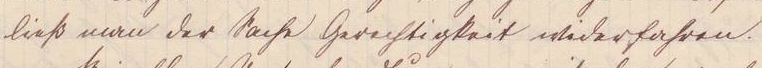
ließ man der Sache Gerechtigkeit widerfahren.
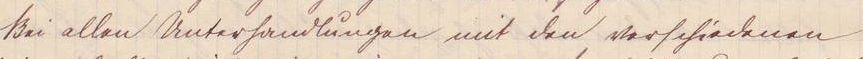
Bei allen Unterhandlungen mit den verschiedenen
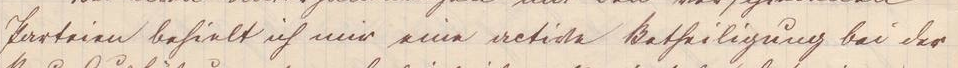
Parteien behielt ich mir eine active Betheiligung bei der
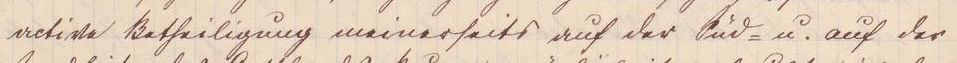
active Betheiligung meinerseits auf der Süd- u. auf der
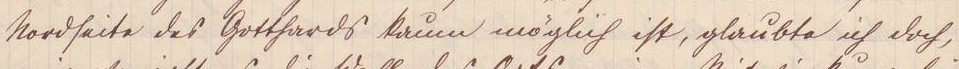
Nordseite der Gotthards kaum möglich ist, glaubte ich doch,
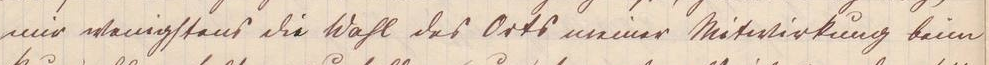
mir wenigstens die Wahl des Orts meiner Mitwirkung beim
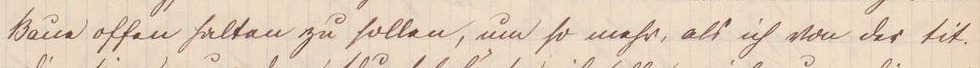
Baue offen halten zu sollen, um so mehr, als ich von der tit.
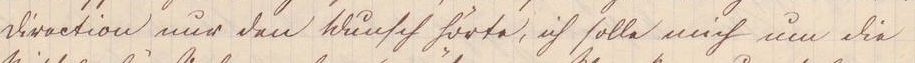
Direction nur den Wunsch hörte, ich solle mich um die
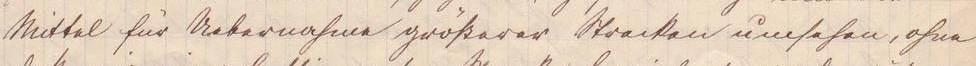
Mittel für Uebernahme größerer Strecken umsehen, ohne
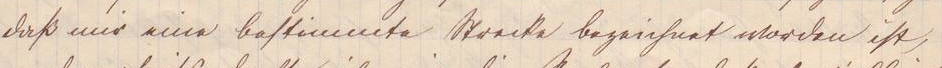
daß mir eine bestimmte Strecke bezeichnet worden ist,
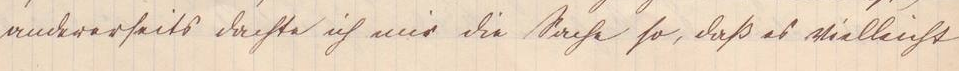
andererseits dachte ich mir die Sache so, daß es vielleicht
